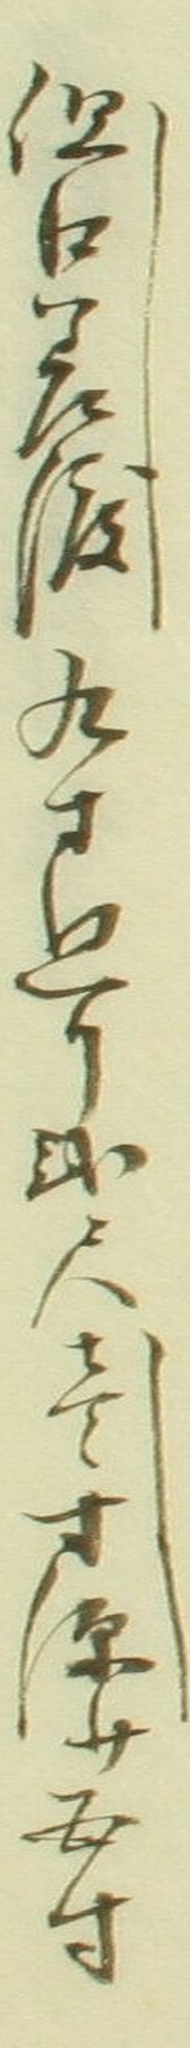但口差渡九寸廻り弐尺壱寸深サ五寸
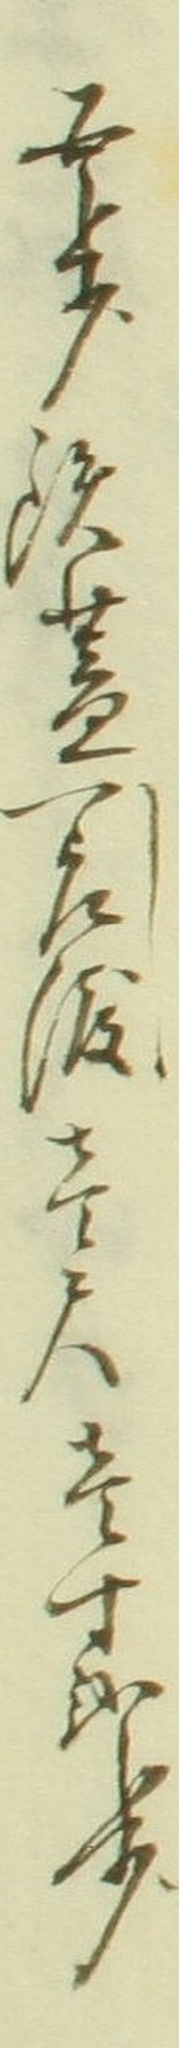五歩鉄蓋差渡壱尺壱寸弐歩
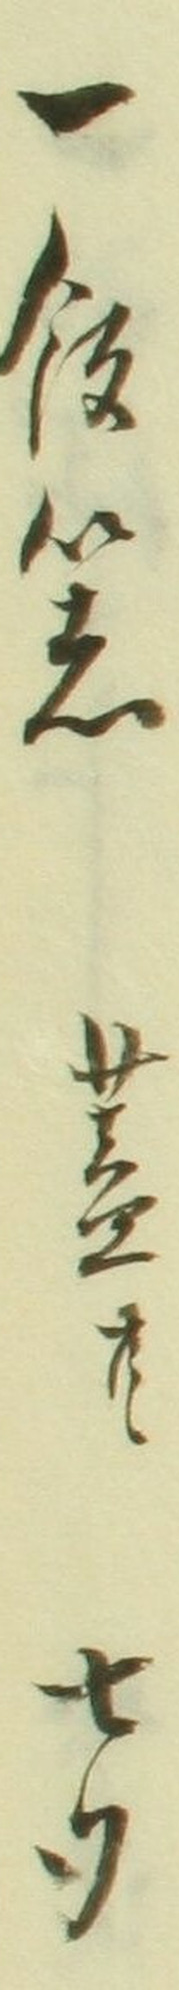一飯器蓋共七ツ

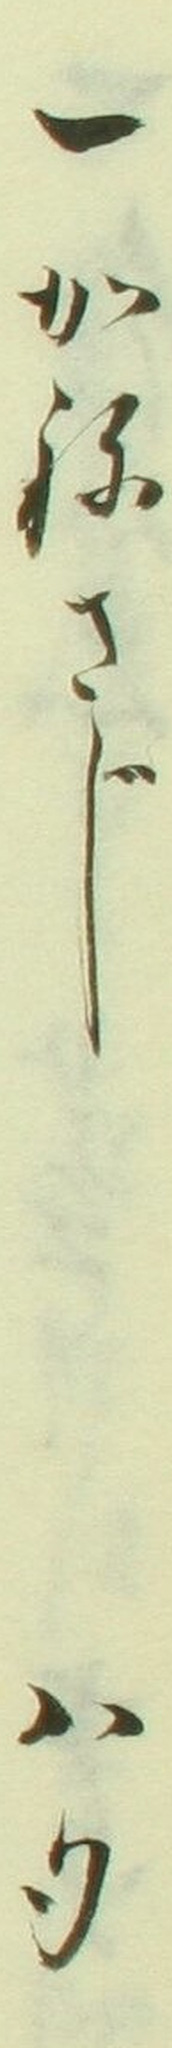一かねさじ八ツ
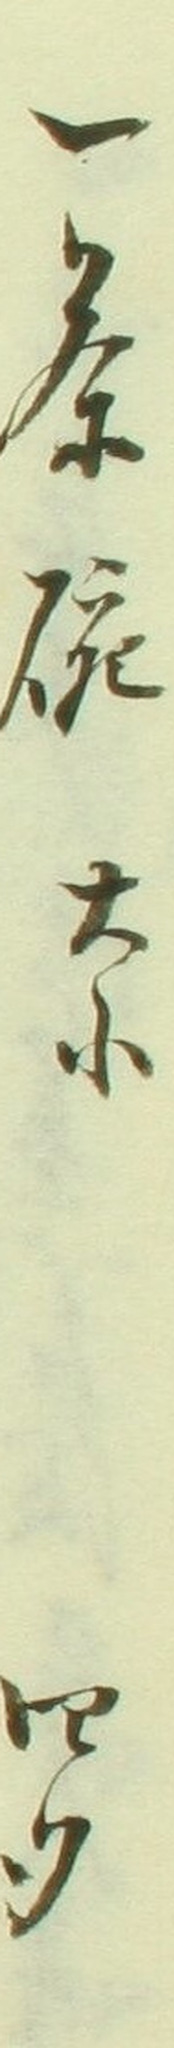一茶碗大小四ツ
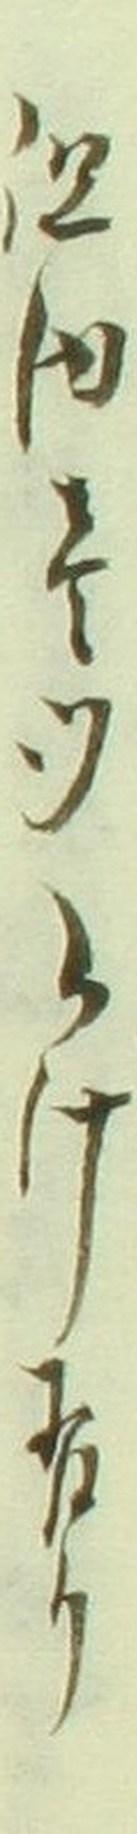但内壱ツかげ有り
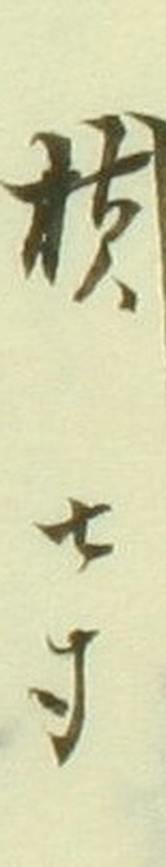横七寸
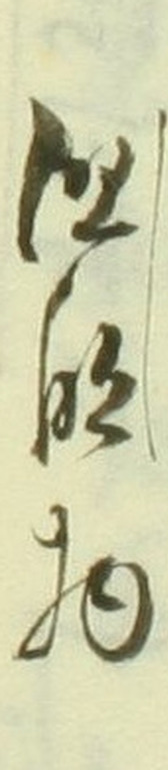但段物
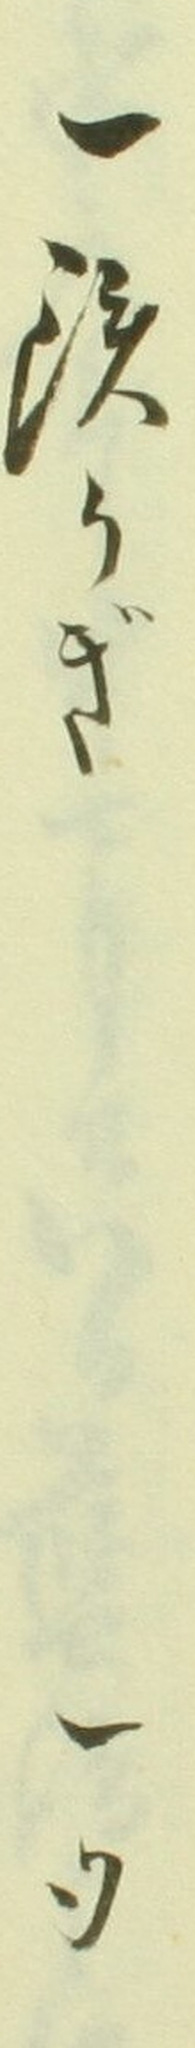一鉄かぎ一ツ
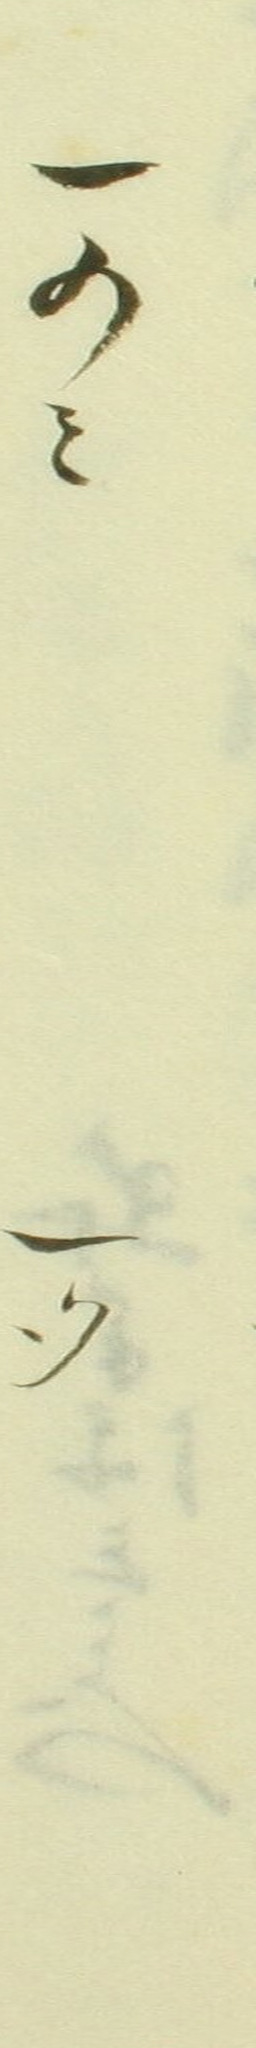一のみ一ツ
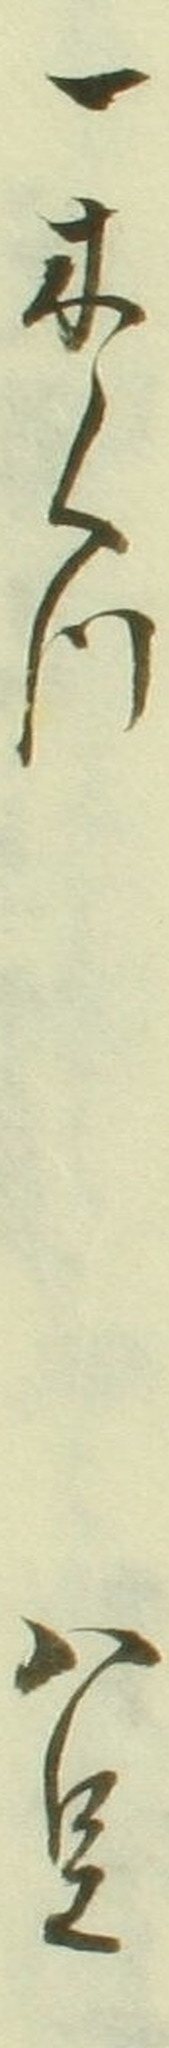一木くつ八足
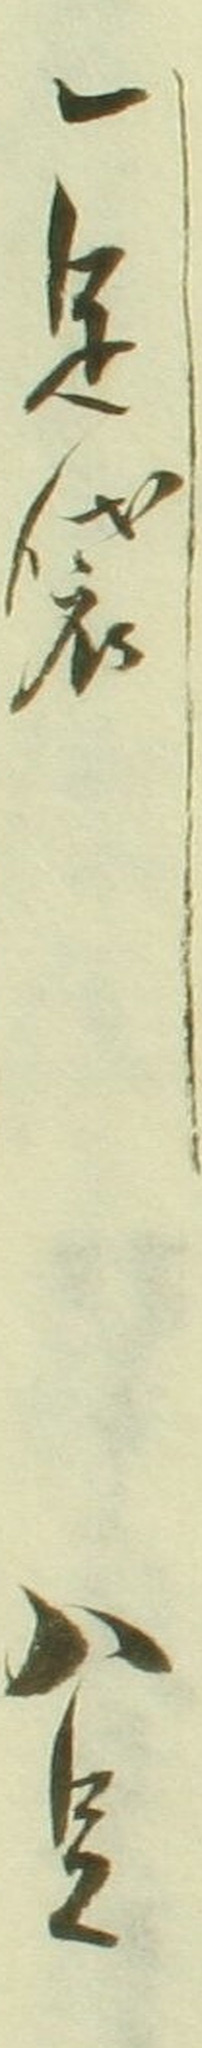一足袋八足
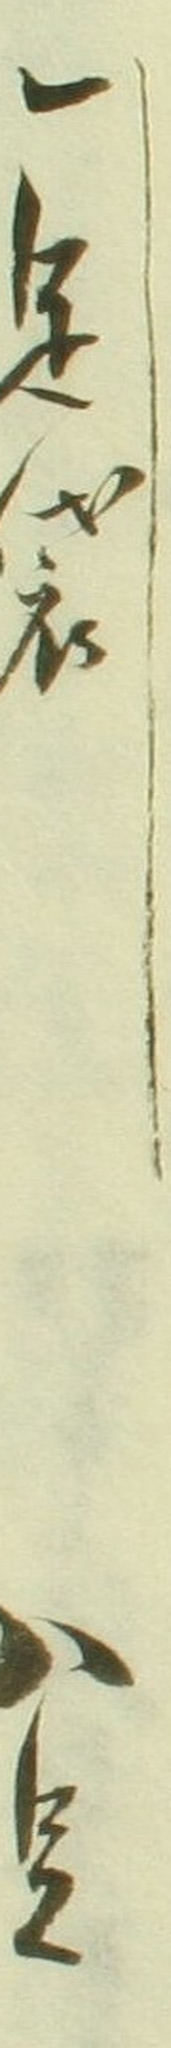一足袋八足
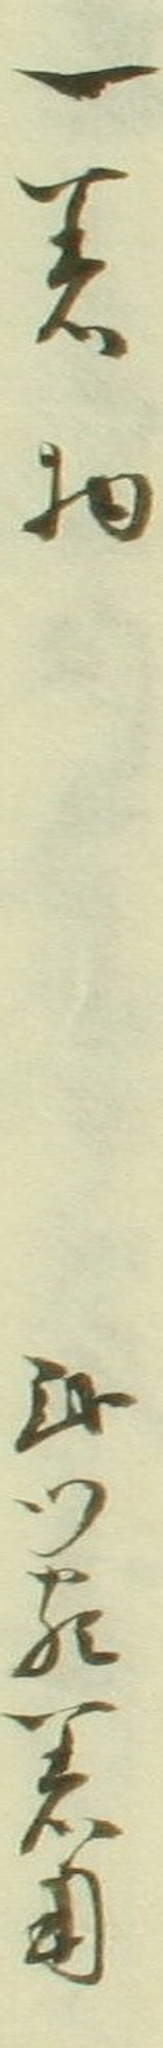一着物弐ツ宛着用
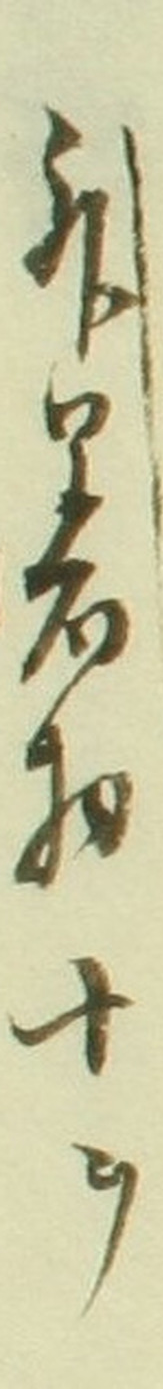外着物十ツ
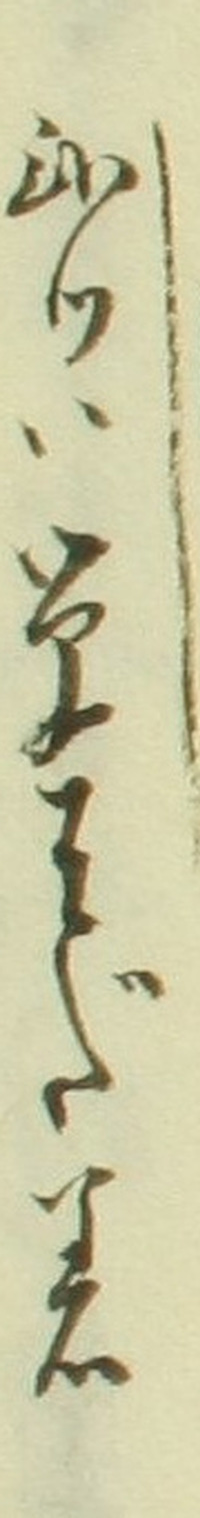弐ツハ単はだ着
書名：異国船漂着記
